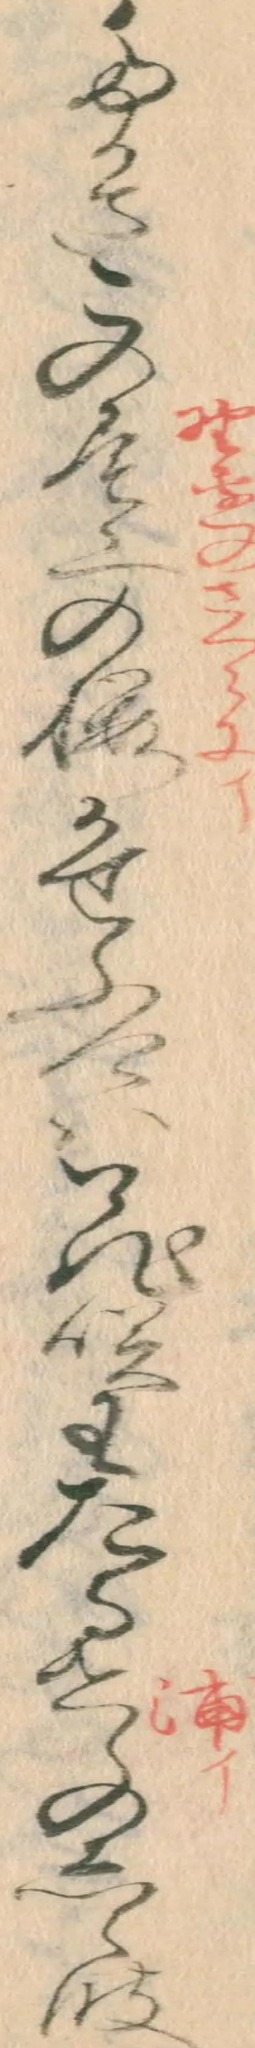たかさこの尾上の桜かせふけは花咲わたるせゝのしら波
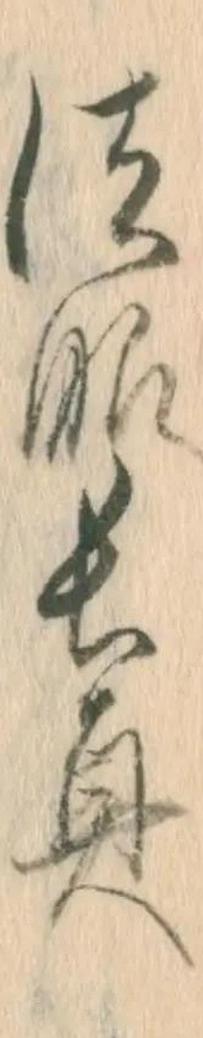方眼長真
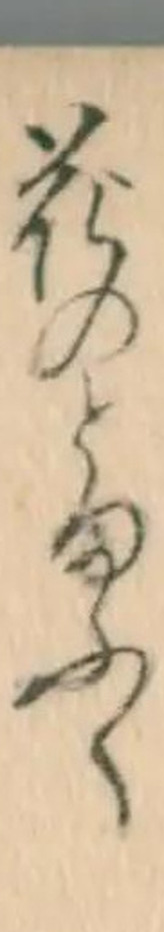花のとまふく
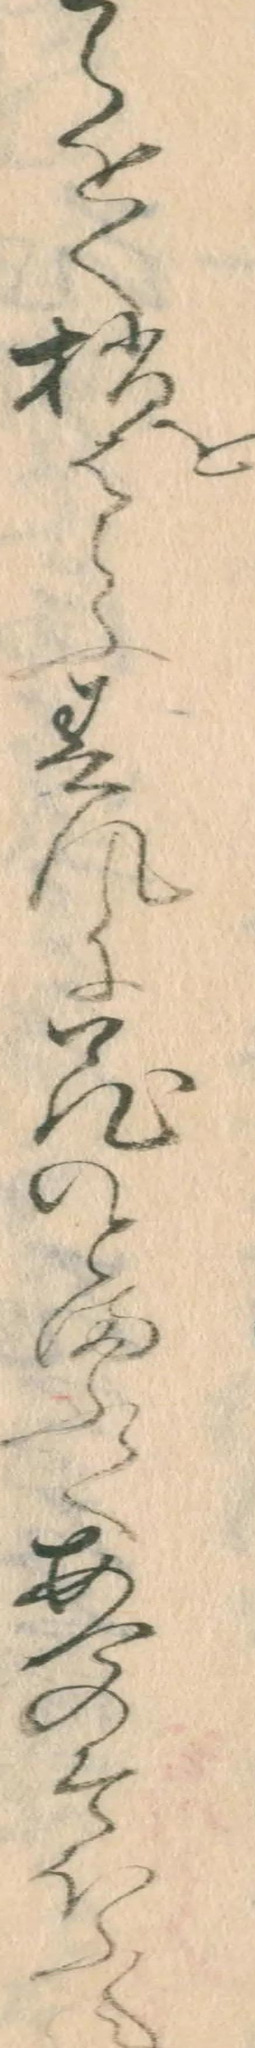うら近く梢をはらふ春風に花のとまふくあけのそほふね
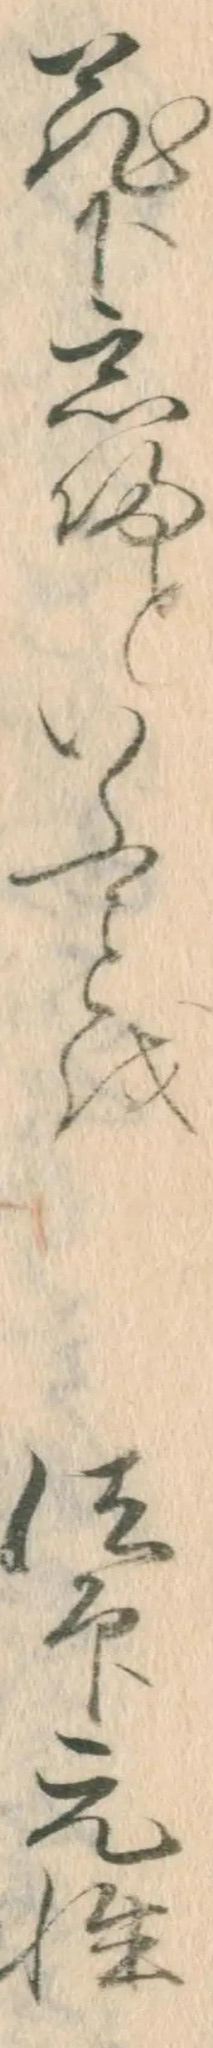花下忘帰といふことを法印元性
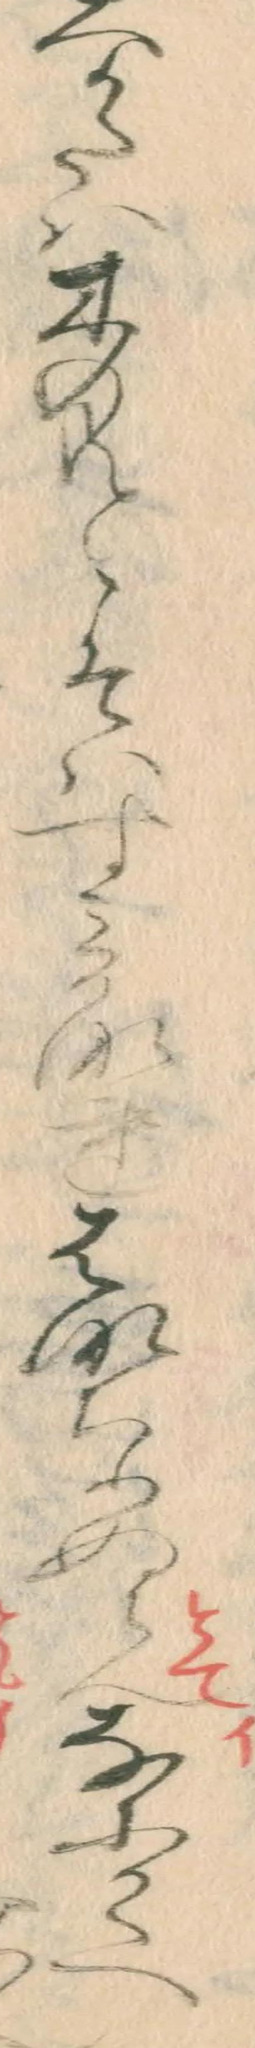大かたは木のもとこそはすみかなれはなちりぬらんなにかゝへらん
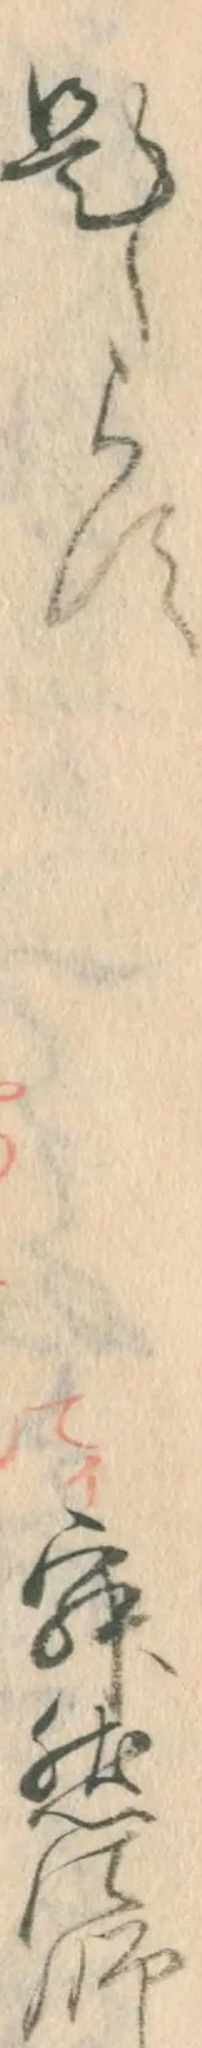題しらす寂然法師
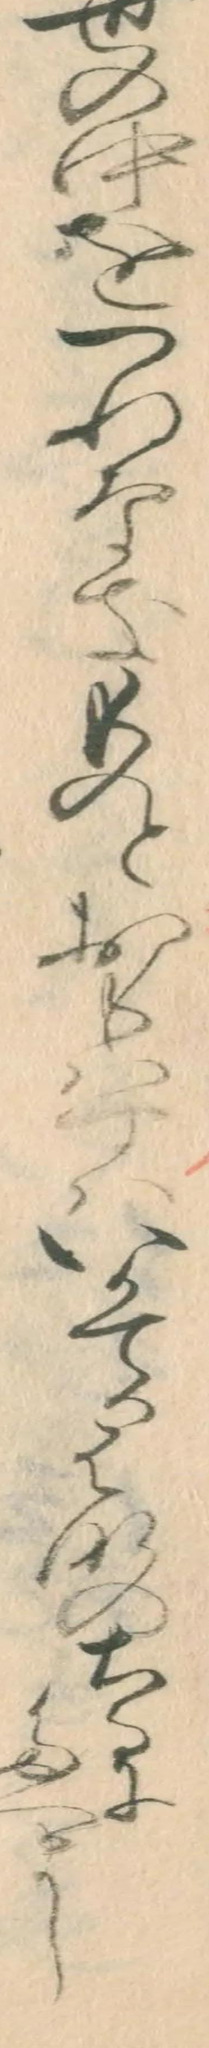世の中をつねなきものとおもはすはいかてかはなのちるにたへまし

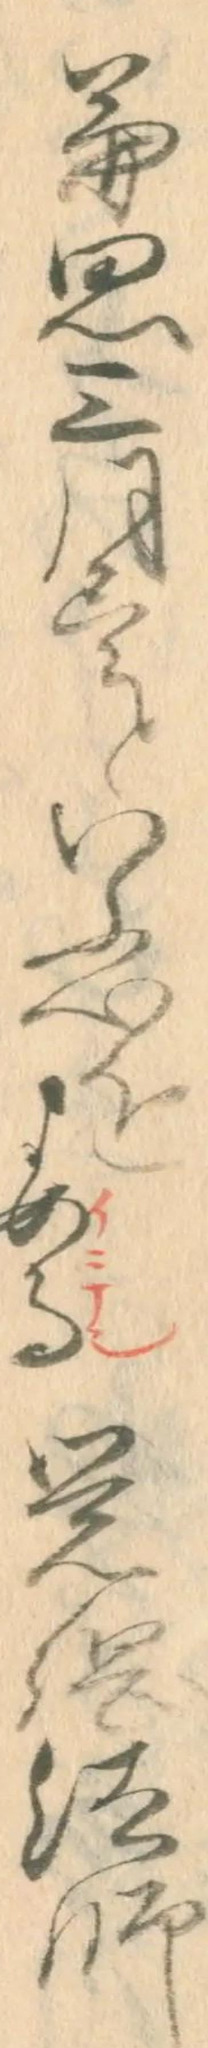兼思三月尽といふ心をよめる覚綱法師
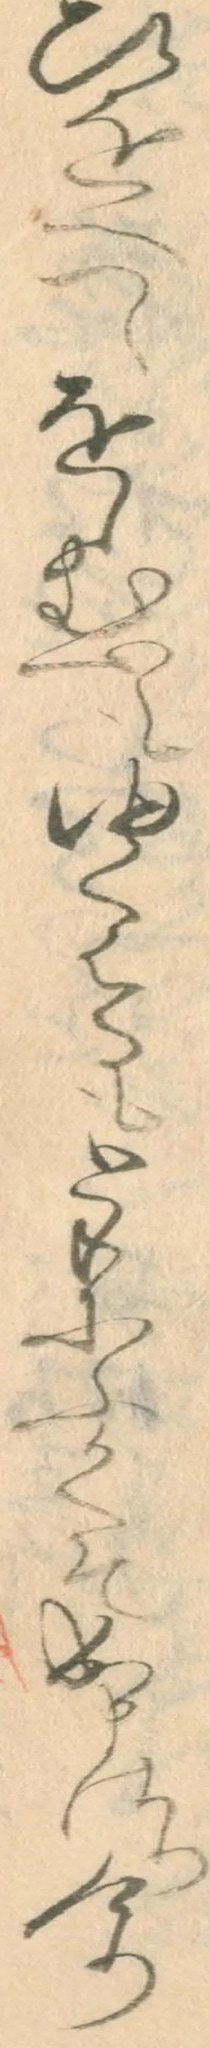ひをへつゝをしむ心もゆくはるもともにふかくそ成まさりけり
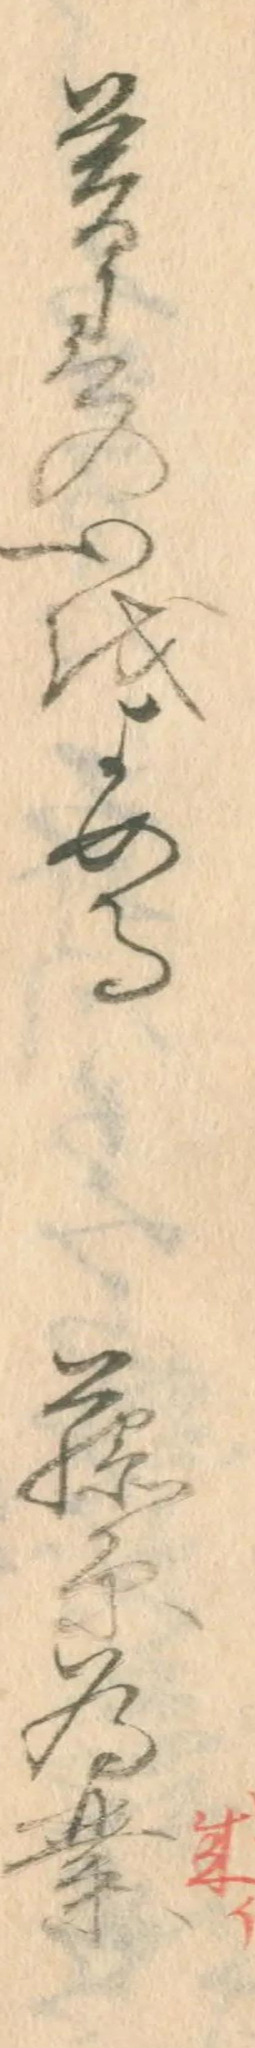暮春の心をよめる藤原為業
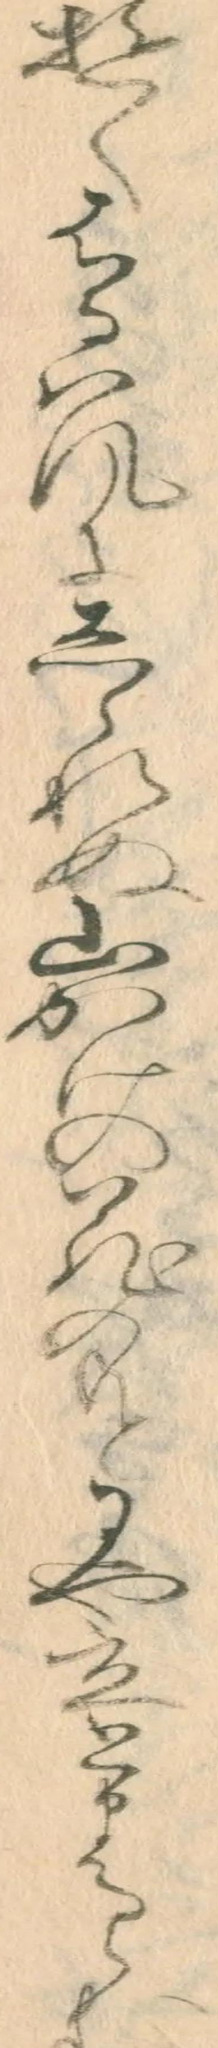ゆくはるは風にしられぬ山かけの花のもとにや立とまるらむ
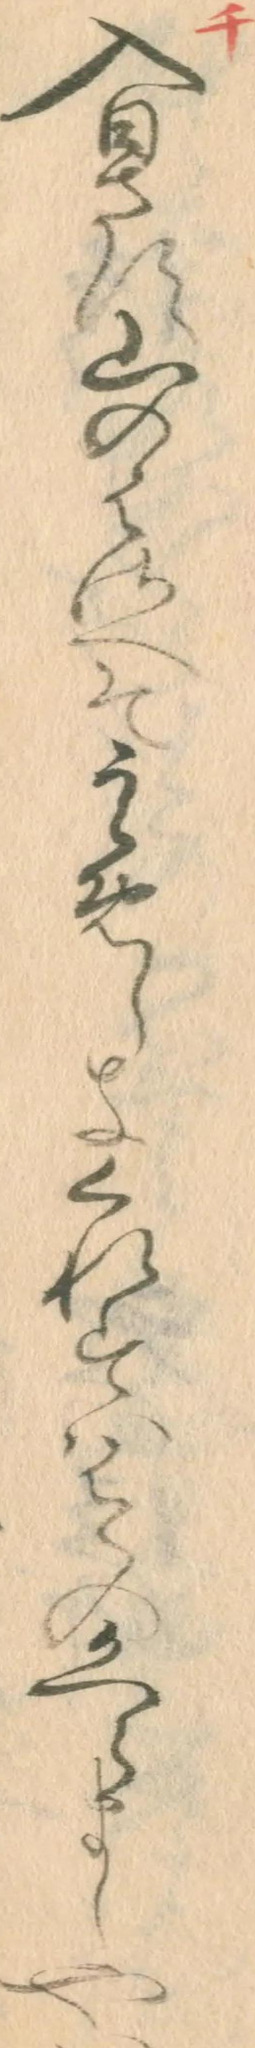入日さす山のはさへそうらめしきくれすははるのかへらましやは
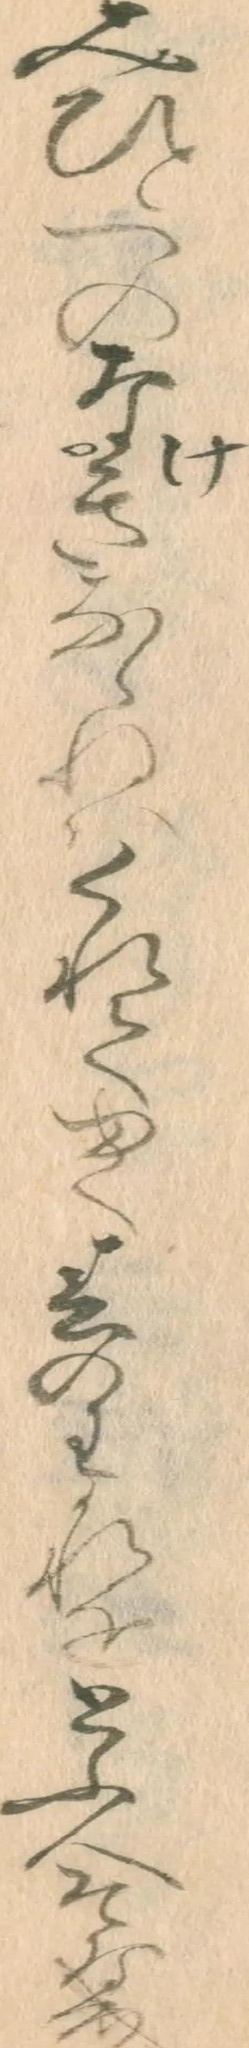みひとつのな◦きならねはくれてゆく春のわかれをとふ人そなき
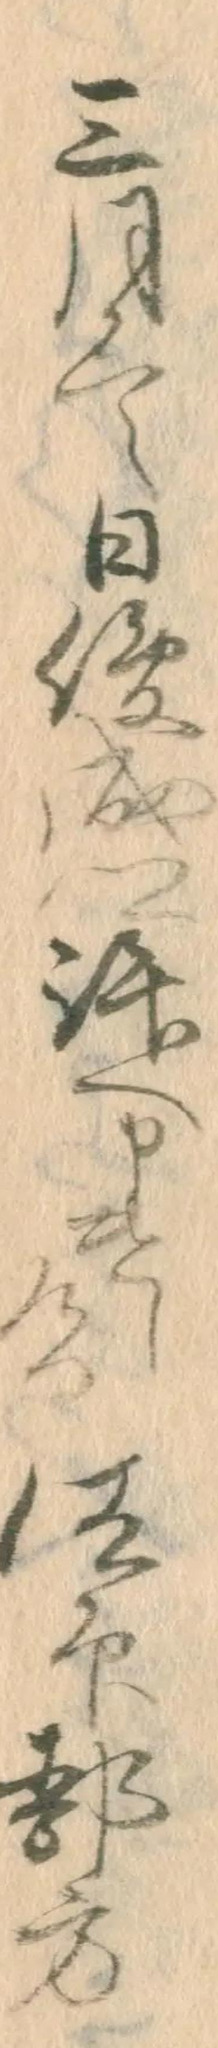三月尽日俊成卿許へ申遣ける法印静方
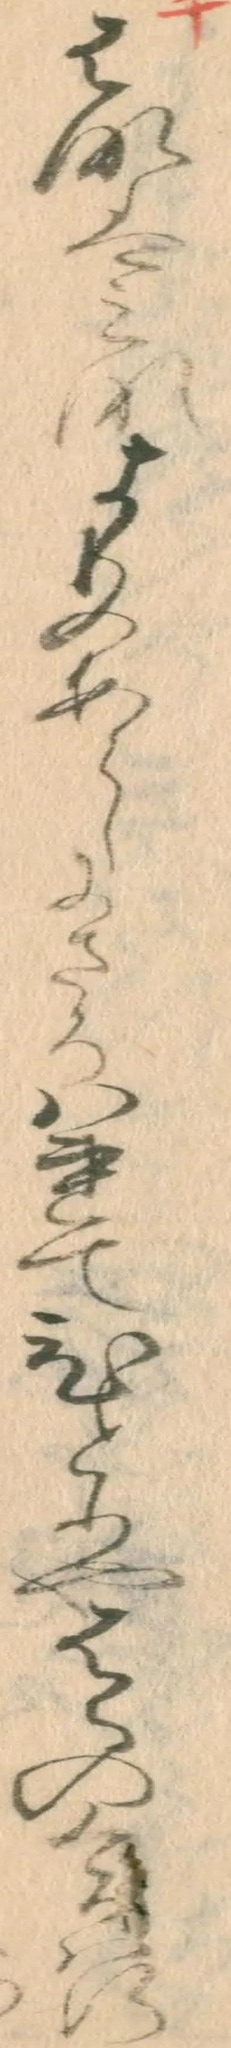はなはみなよものあらしにさそはれてひとりやはるの今日は行らん
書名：月詣和歌集
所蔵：国立国会図書館 National Diet Library, JAPAN
